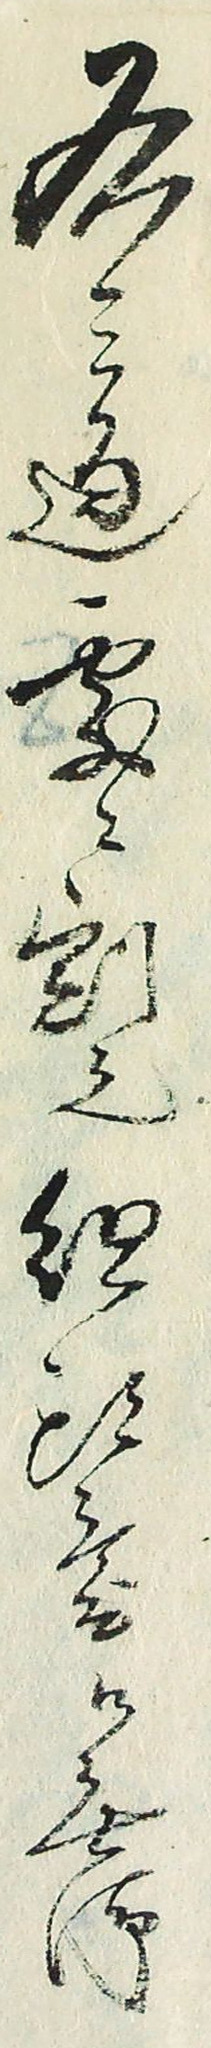右之通処々割元組頭庄屋え無滞
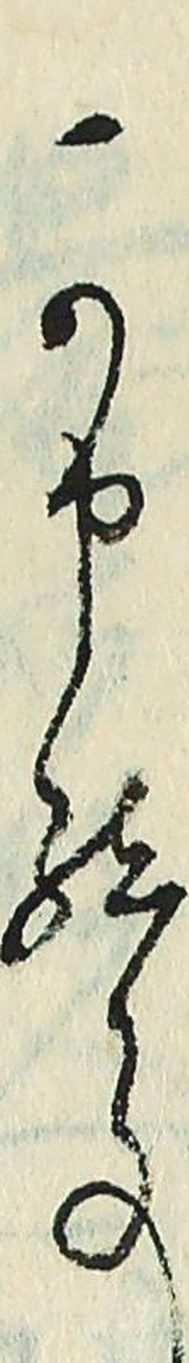可申継事
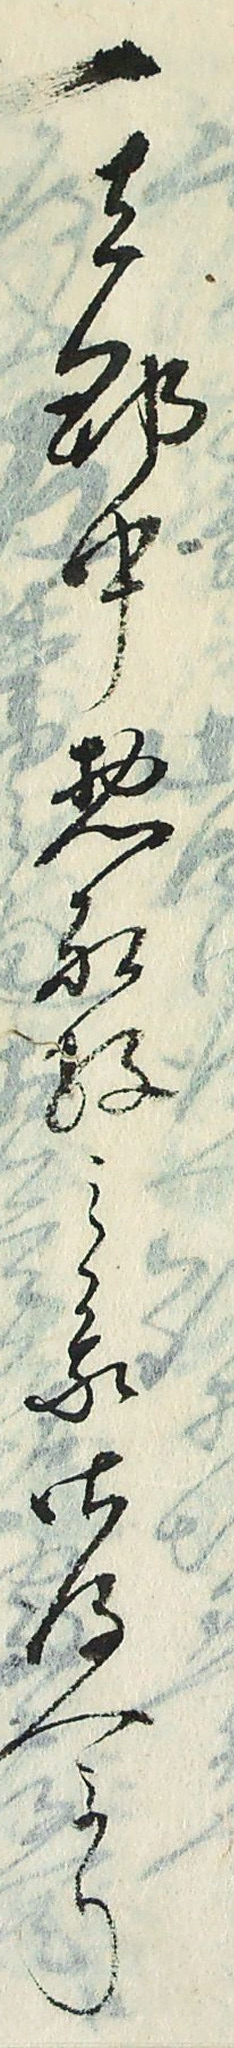其郡中惣船数之義御役人より
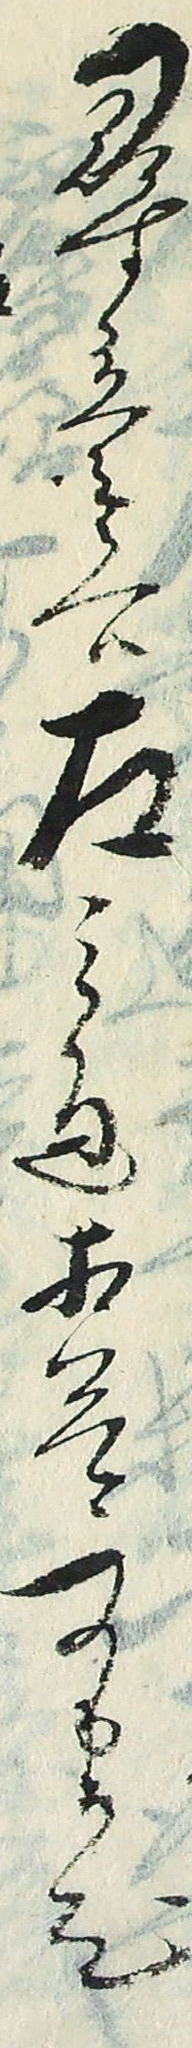尋有之候へは左之通相答可申候尤
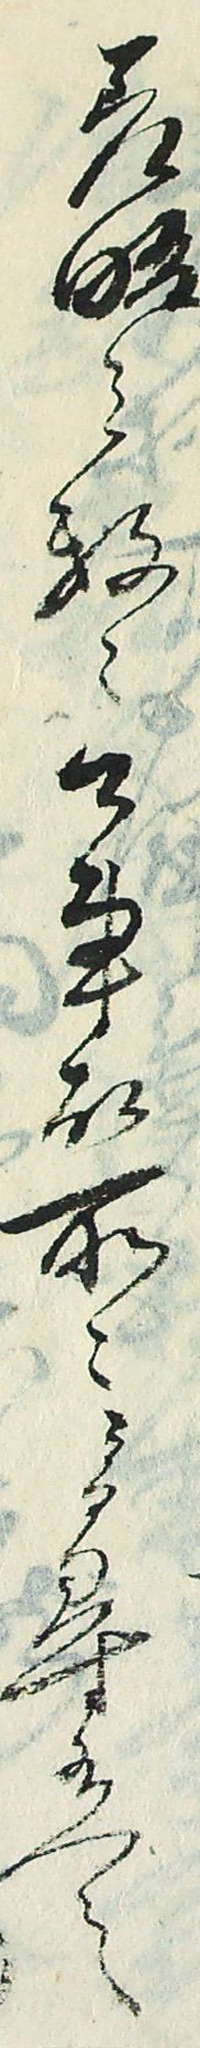差略之数に候事故所々にて尋有之
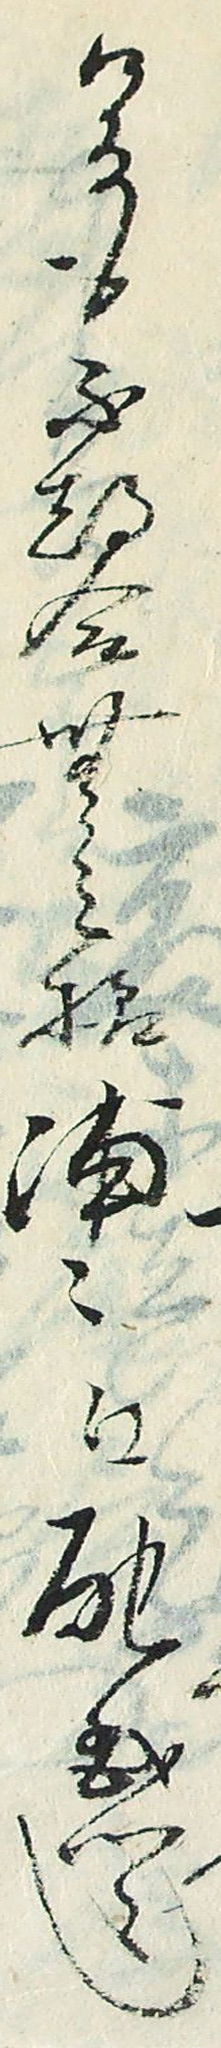候ても不都合無之様浦々え配当いたし
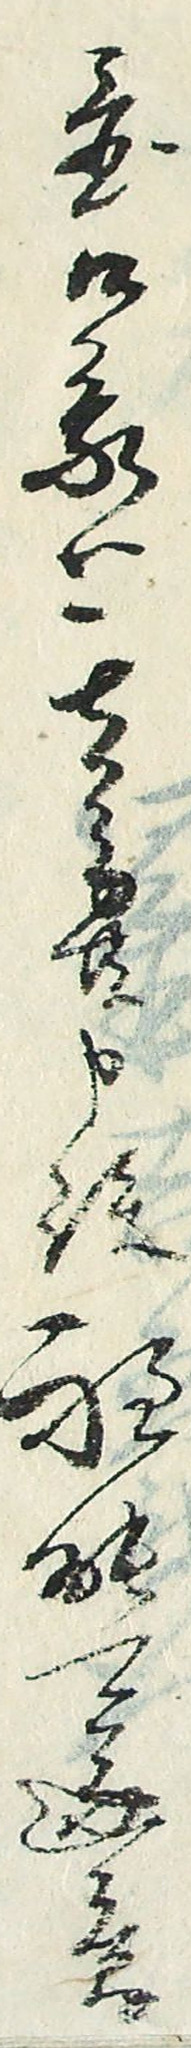置候義は其方共申談程能可遂意

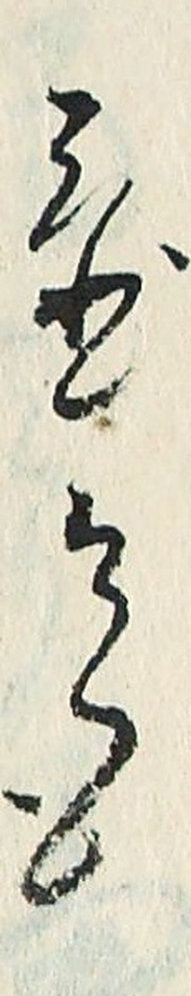置候以上
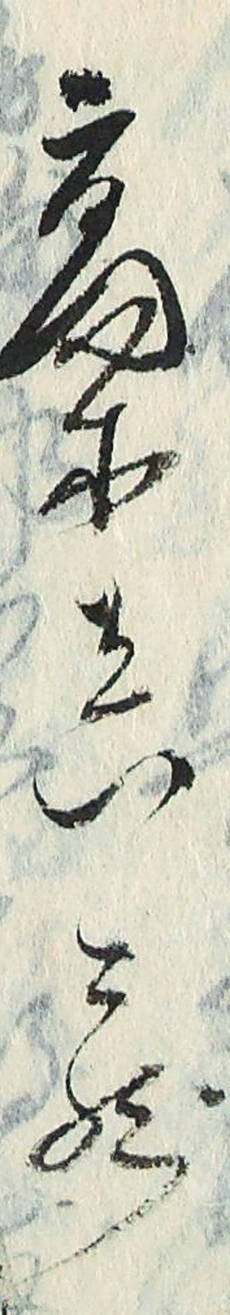高木真蔵
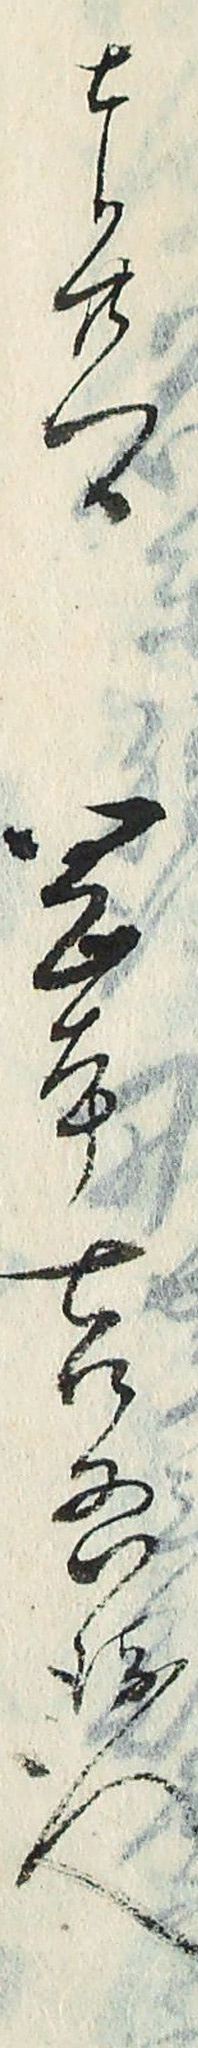七月廿一日岡本吉右衛門
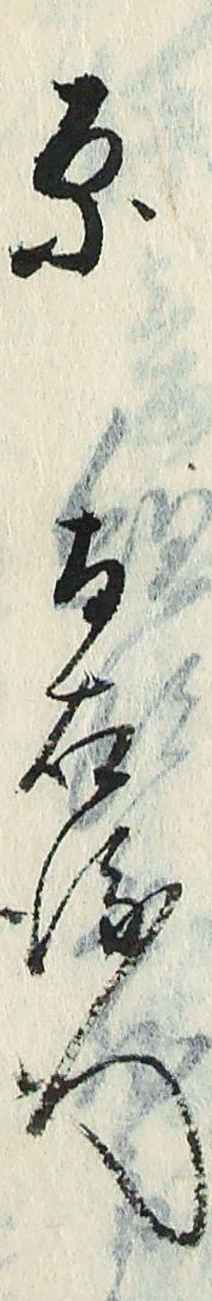原与右衛門
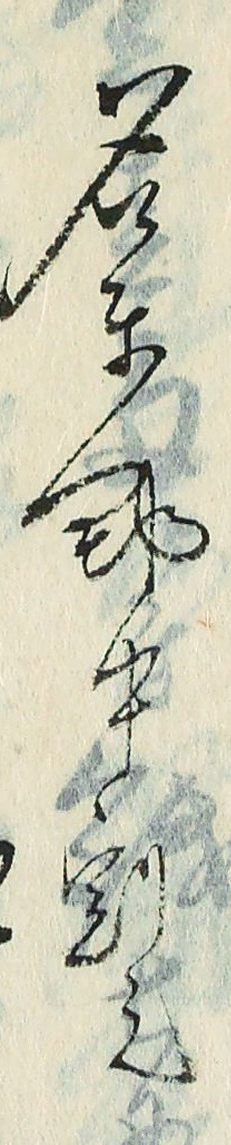名東郡中割元
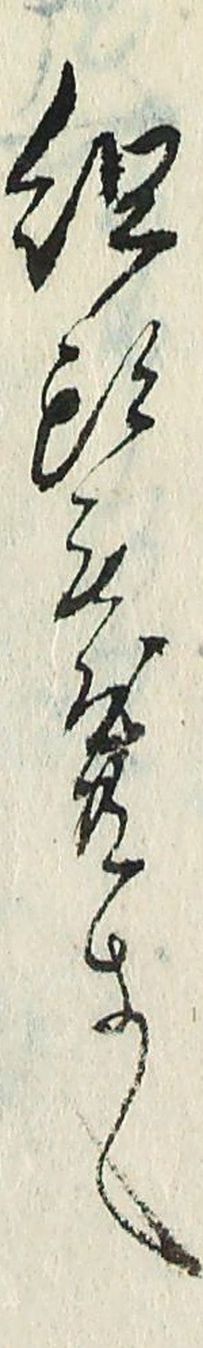組頭庄屋共方へ
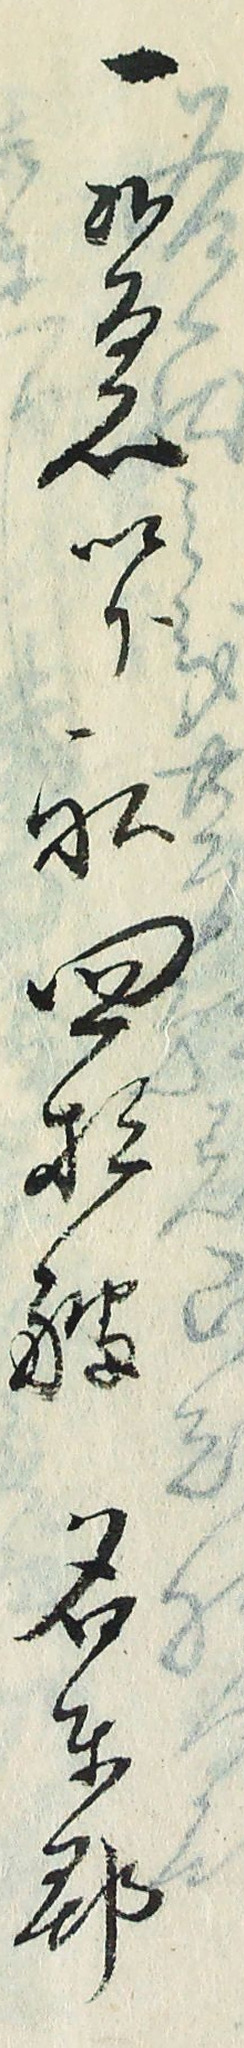一弐百石以下船四拾艘名東郡
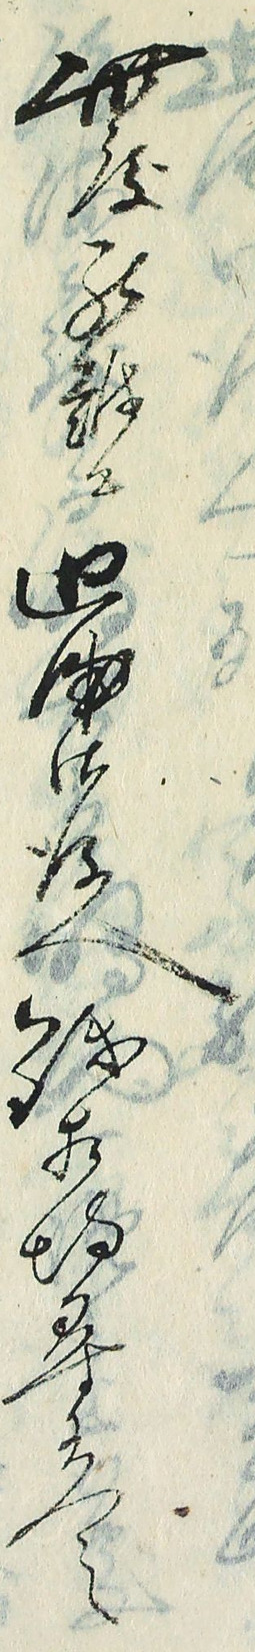此度罷越候廻浦御役人錢相場尋有之
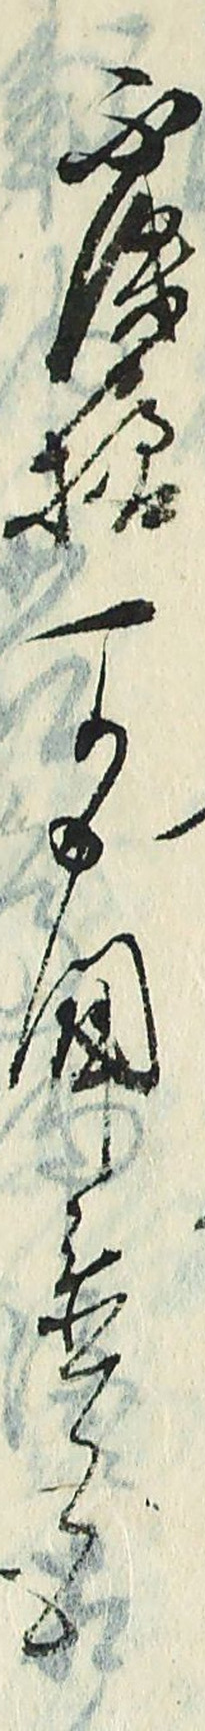不洩様可申聞置候以上
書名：公辺御役人為御廻浦御立越諸御用一巻
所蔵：鳴門教育大学 Naruto University of Education
